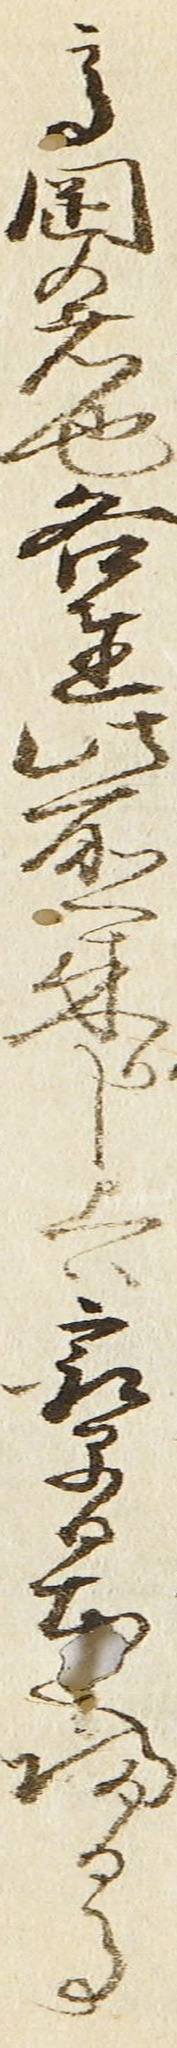高岡の者也各達此所へ来りし上ハ最早日本へ帰る事
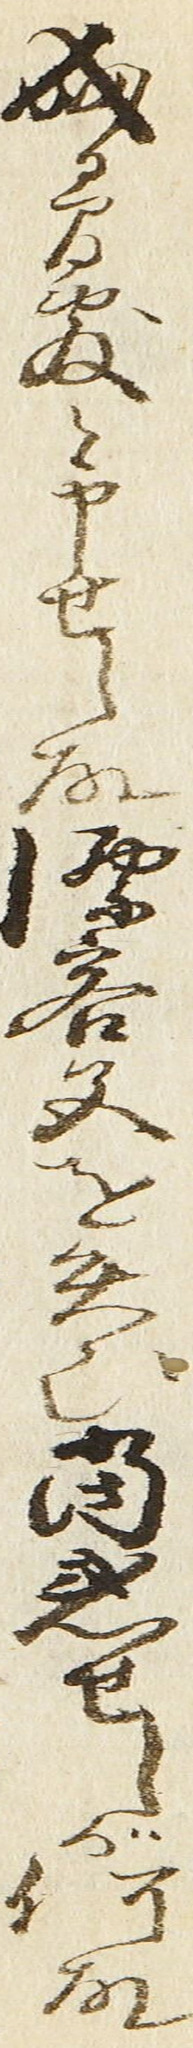成る間敷と申せし故漂客色を失ひ当惑せしが何故
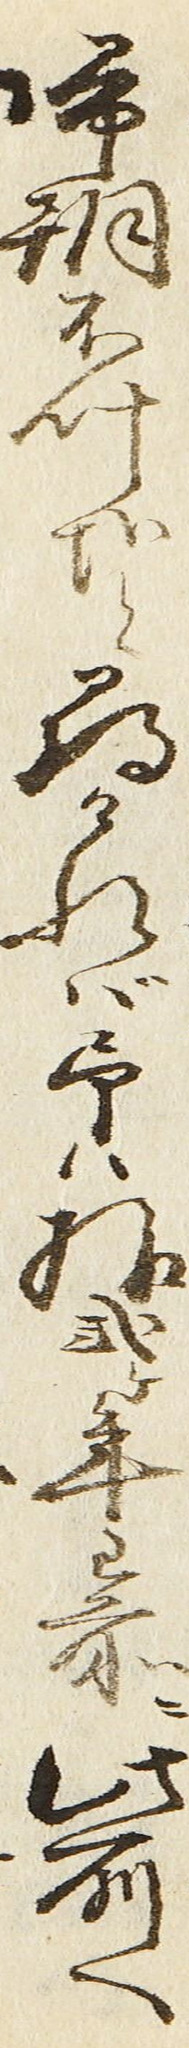帰朝不叶哉と尋けれバ予ハ拾弐ケ年已前ニ此所へ
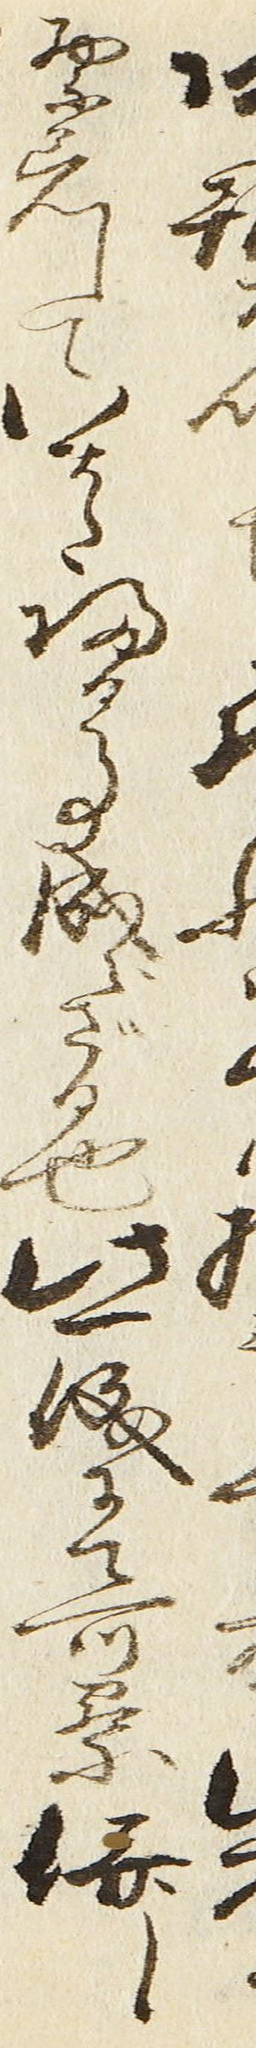漂着していまた帰る事成らざる也此一儀にて可察併し
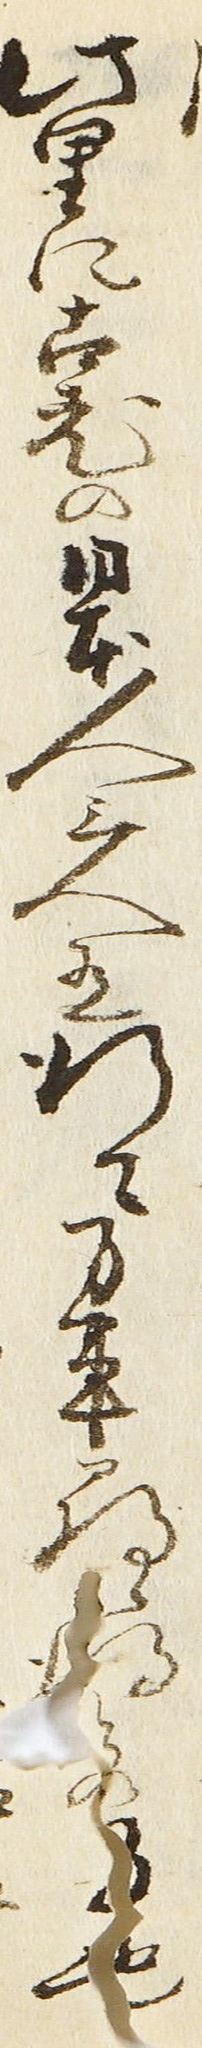此里に古老の日本人三人有得と万事尋候得との事也
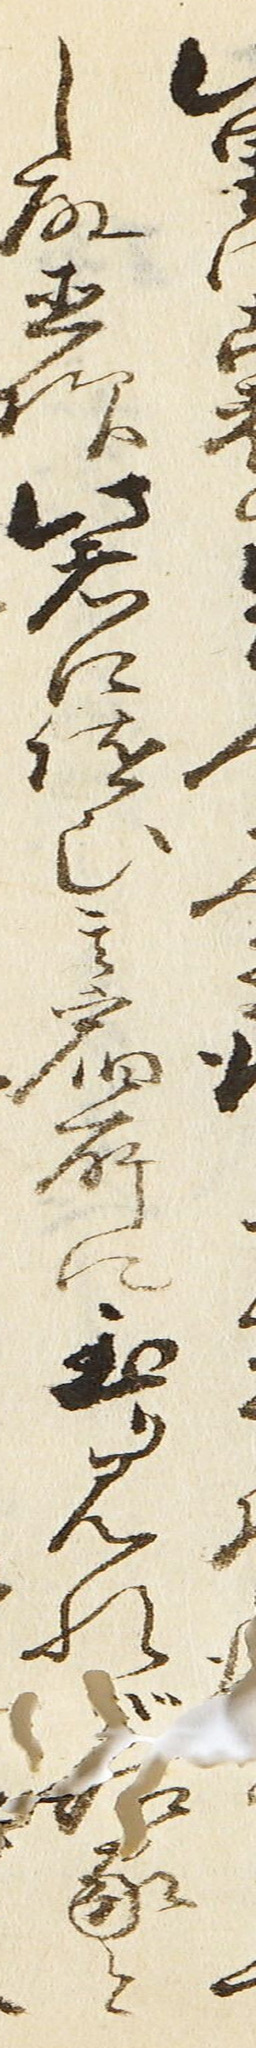し故直様此者に随ひ其宿所に至り見れバ家と
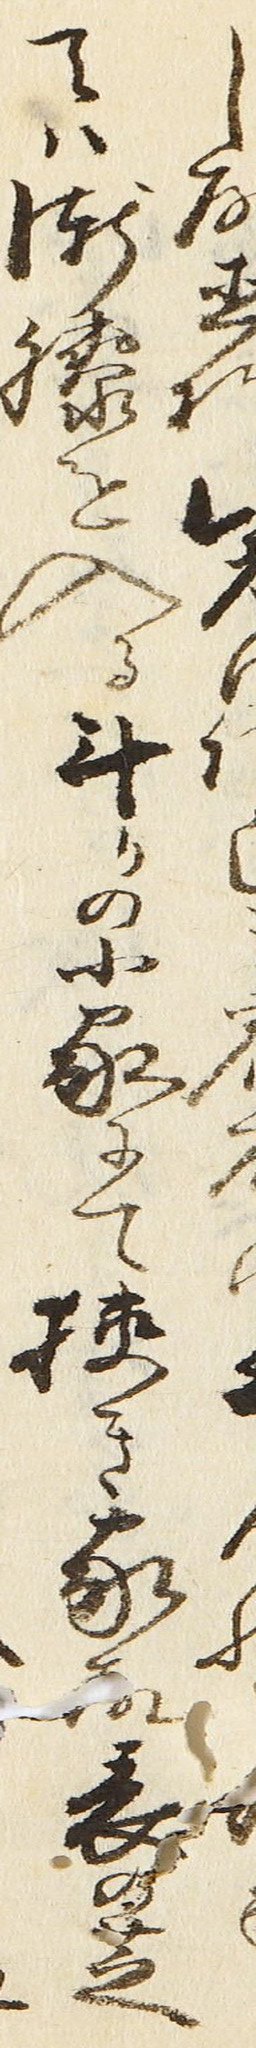てハ漸膝を入る計りの小家にて狭き家故表の芝
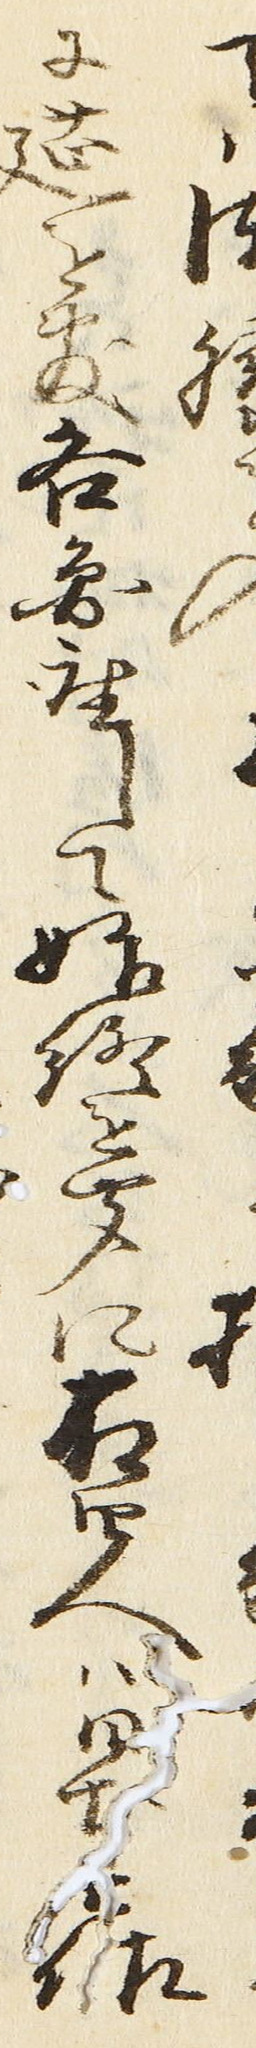に筵を敷各円座して始終を聞に右四人ハ日本土佐
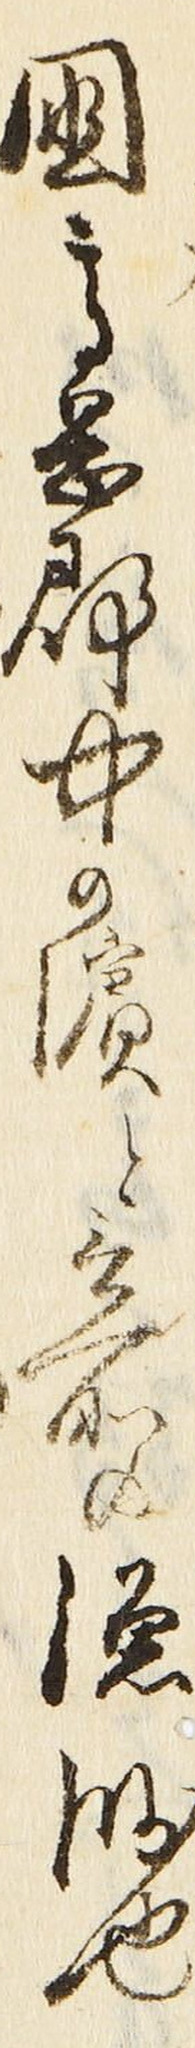国高岡郡中の浜と言所の漁師也
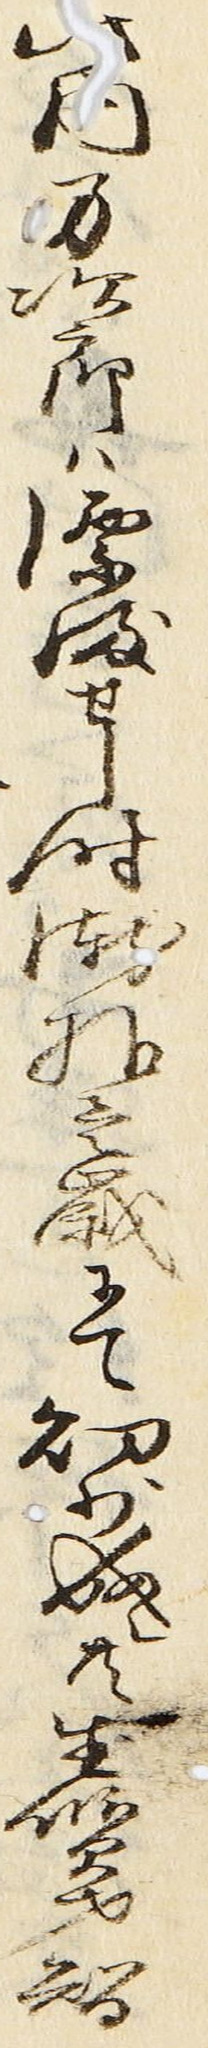此内万次郎ハ漂流せし時漸拾壱歳にて幼少成レ共生質才智
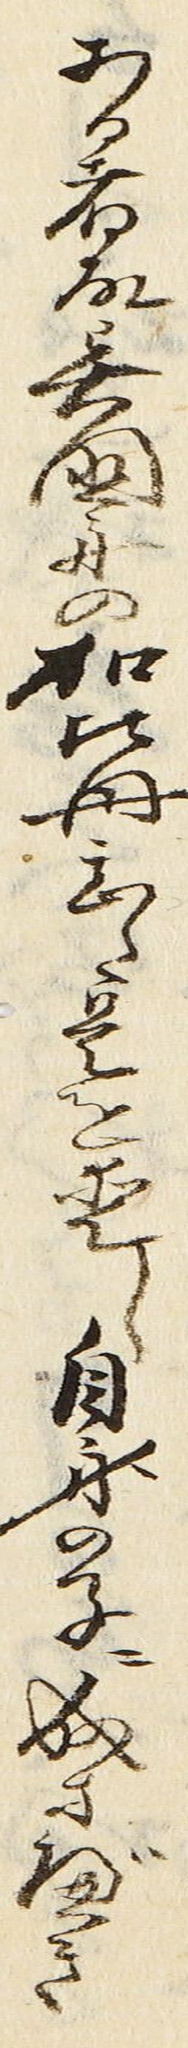ある者故異国舟の加比丹甚た是を愛し自身の子ニ成すべき
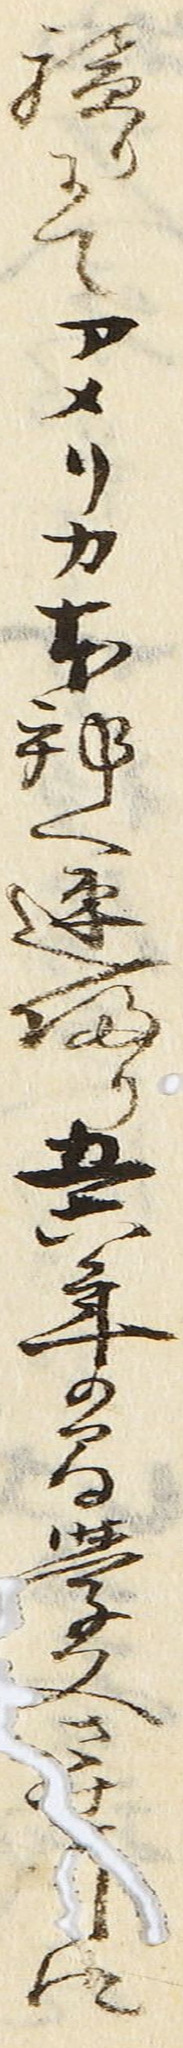積りにてアメリカ本邦へ連帰り五六年の間学文さすけしに
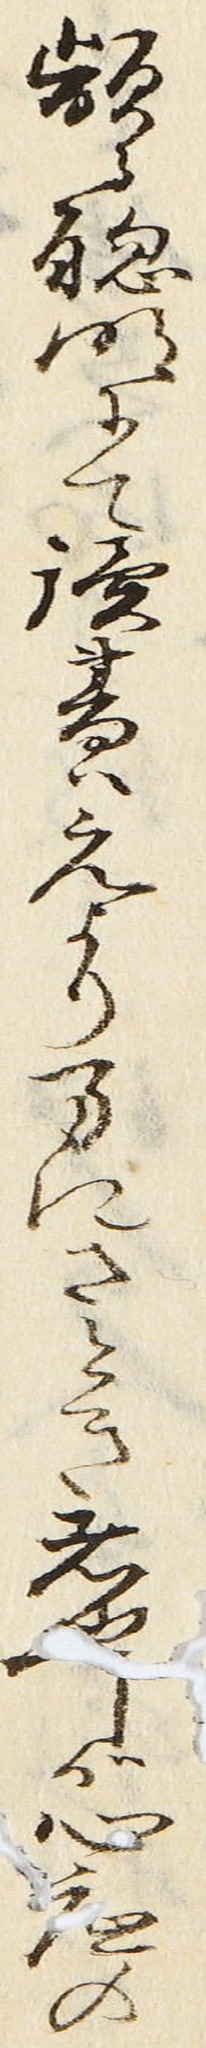頻る聡明にて読書ハ元より万にさとき者也しが心底の
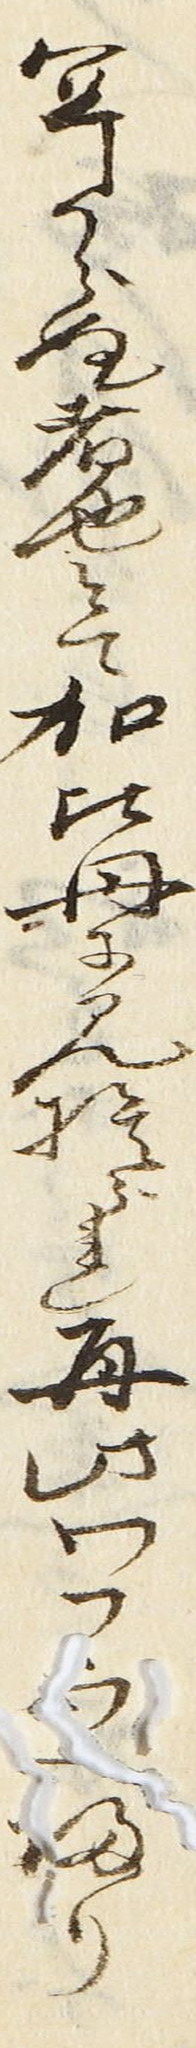宜しからぬ者也とて加比丹に見捨られ再此ワフウへ帰り
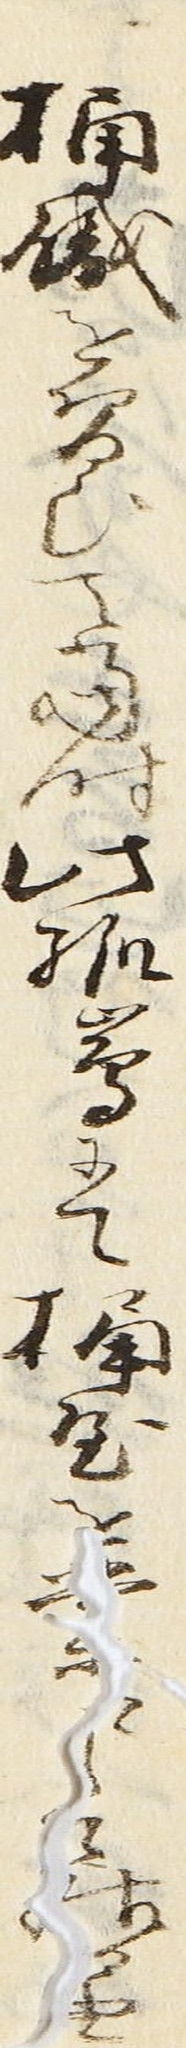桶職を習ひて当時此孤島にて桶屋を業として居候由
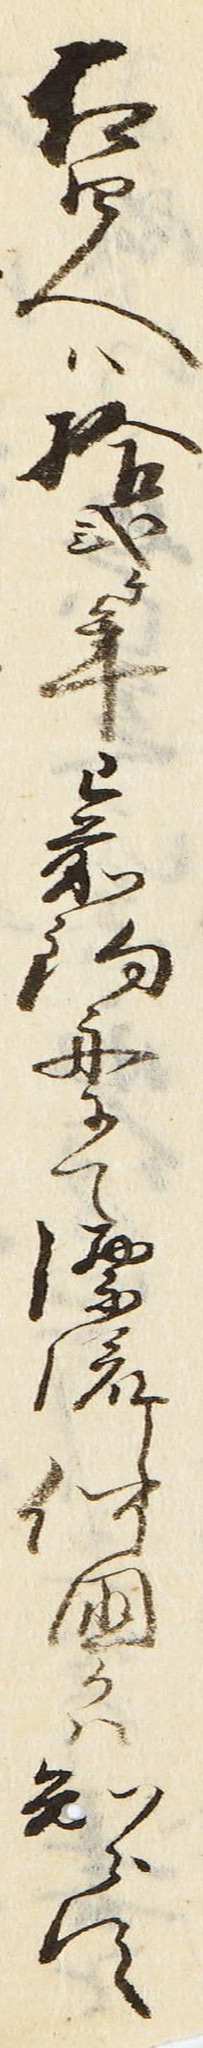右四人ハ拾弐ケ年已前釣舟にて漂流し何国かハ知らす
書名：亜墨利加漂流記聞
